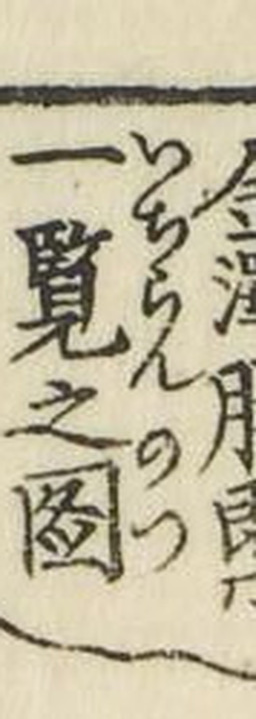一覧之图
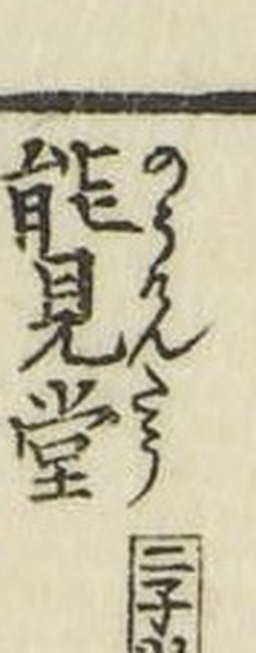能見堂
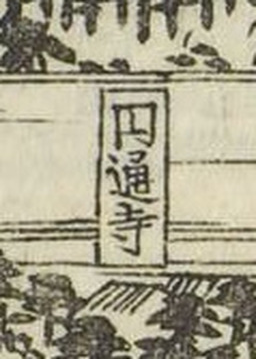円通寺

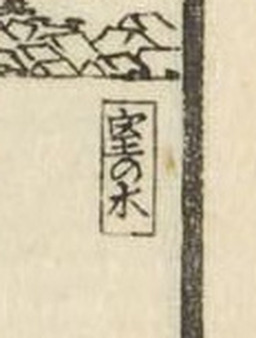室の木

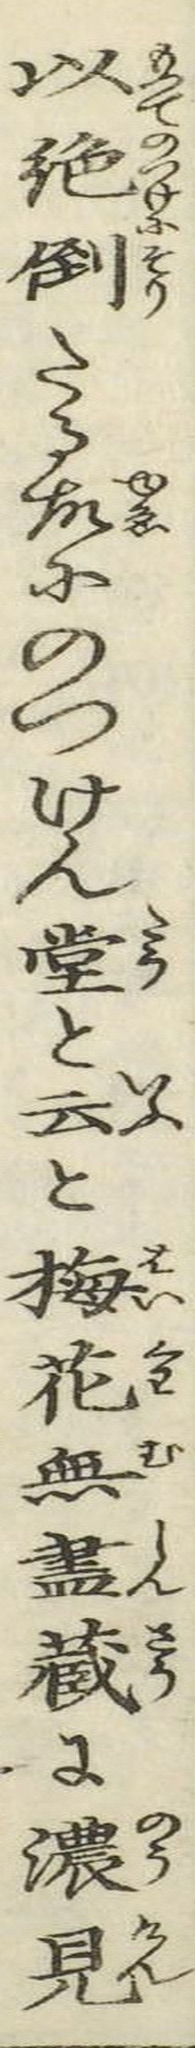以絶倒たる故にのつけん堂と云と梅花無盡蔵に濃見
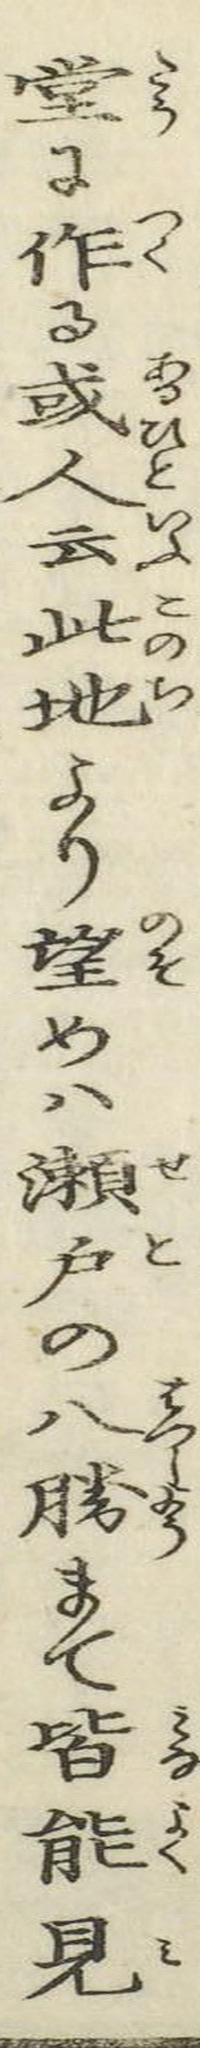堂に作る或人云此地より望めは瀬戸の八勝まて皆能見
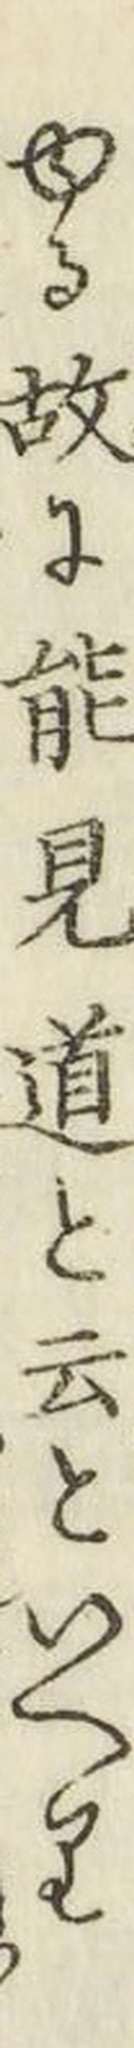ゆる故に能見道と云といへり
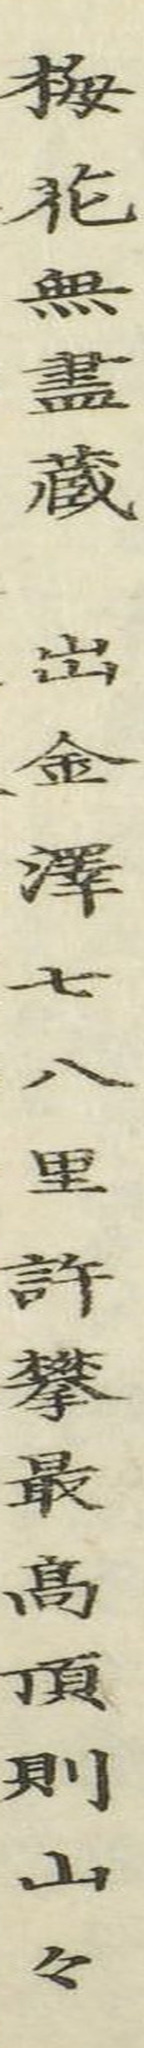梅花無盡蔵出金澤七八里許攀最髙頂則山々
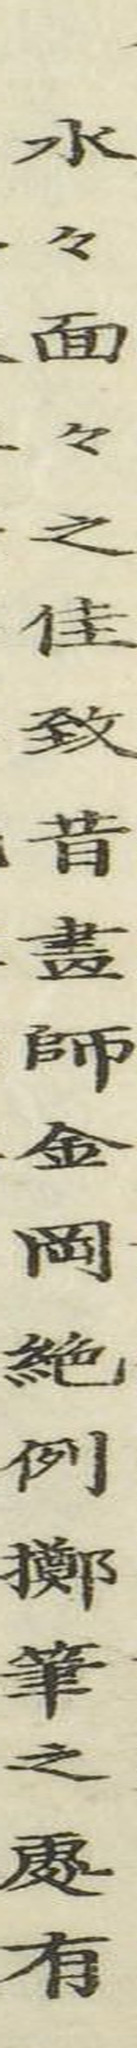水々面々之佳致昔畫師金岡絶例擲筆之處有
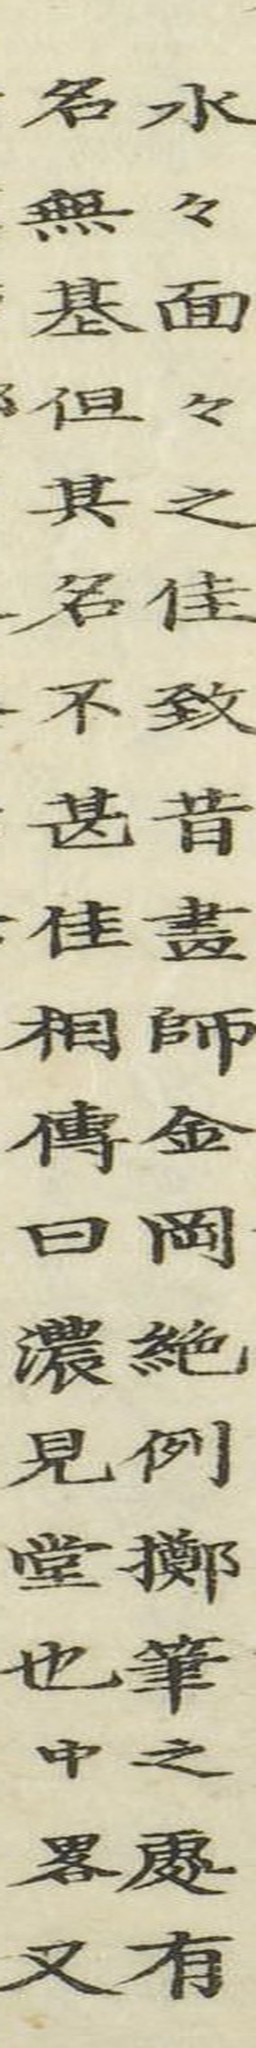名無基但其名不甚佳相傳曰濃見堂也中畧又
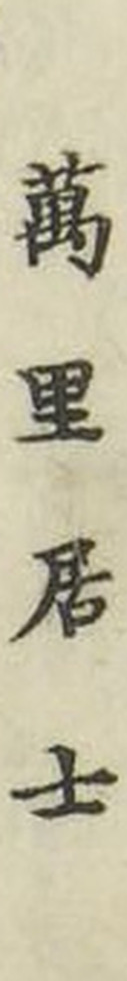萬里居士
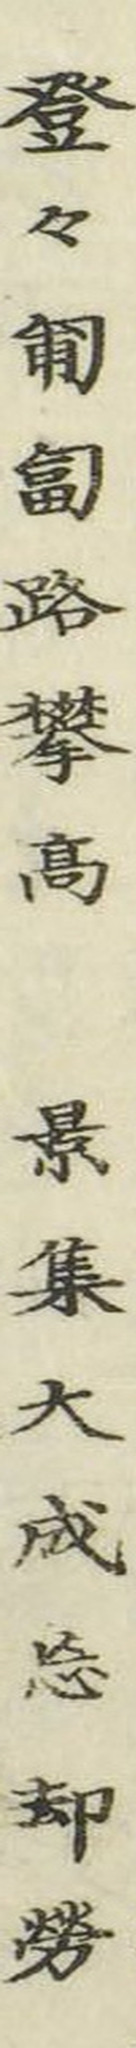登々匍匐路攀髙景集大成㤀却勞
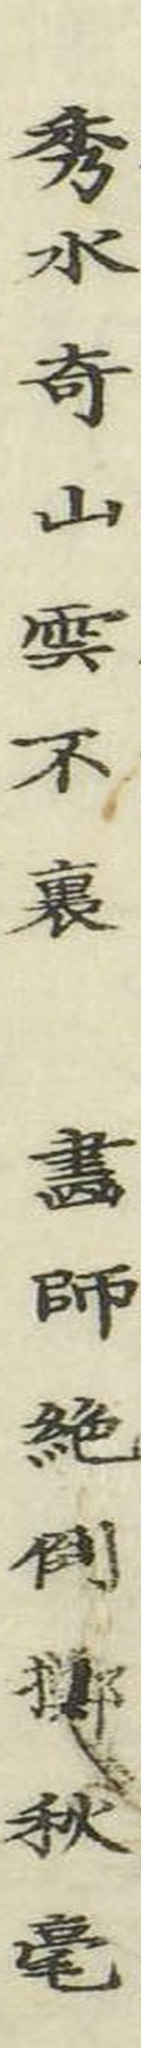秀水奇山雲不裏畫師絶倒擲秋毫
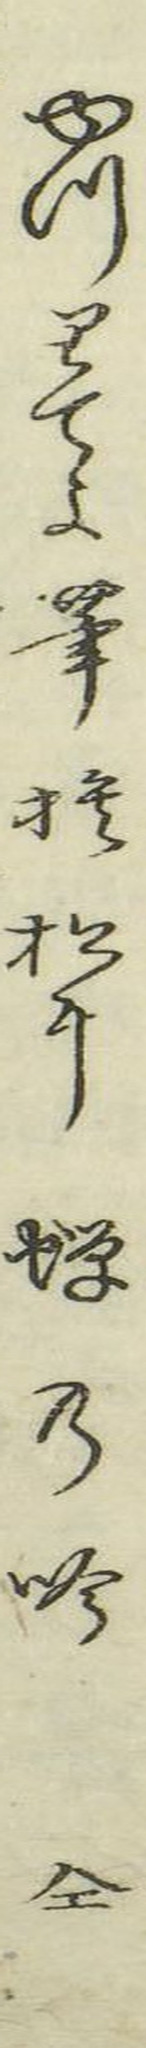ゆつりてよ筆捨松に蝉の吟仝
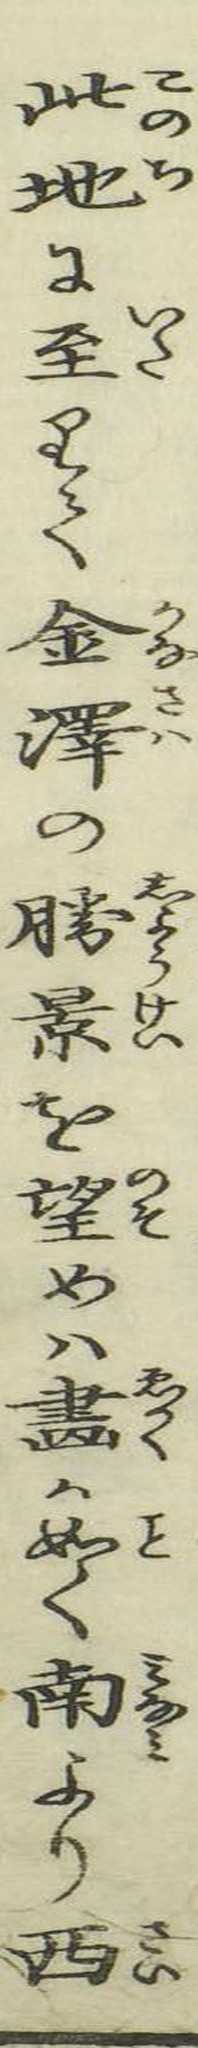此地に至りて金澤の勝景を望めは畫か如く南より西

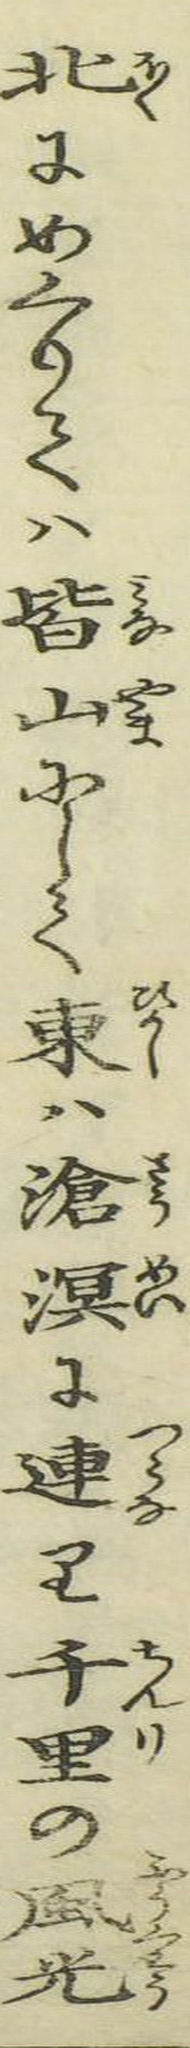北にめくりては皆山にして東は滄溟に連り千里の風光
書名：江戸名所図会 20巻 巻之6
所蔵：東京学芸大学教育コンテンツアーカイブ
